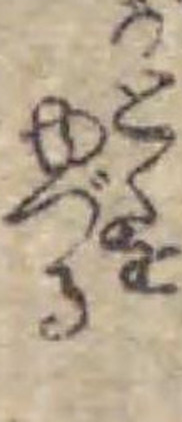ゆづる
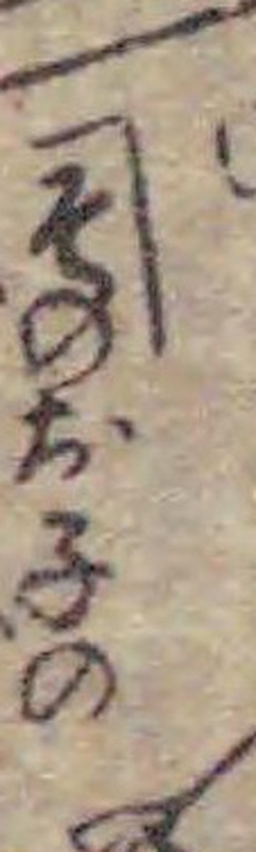〽そのお子の
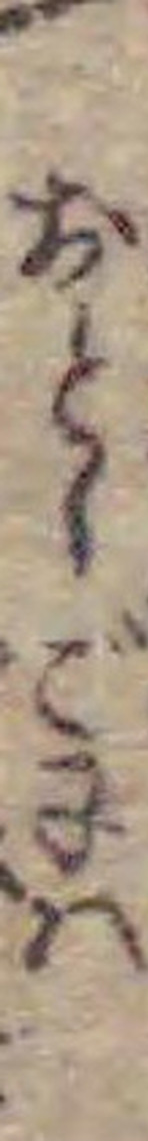おとしごには
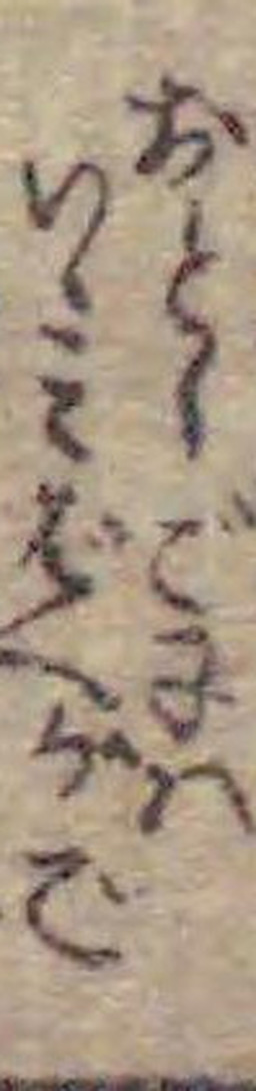いゝみばへがご
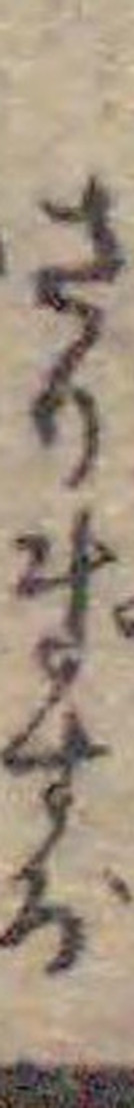さりますが
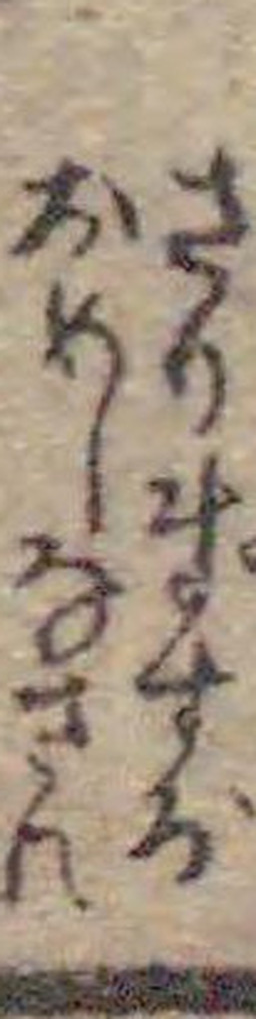おめしなされ
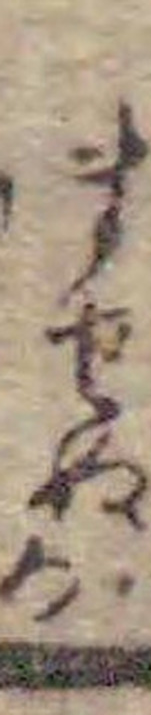ませぬか
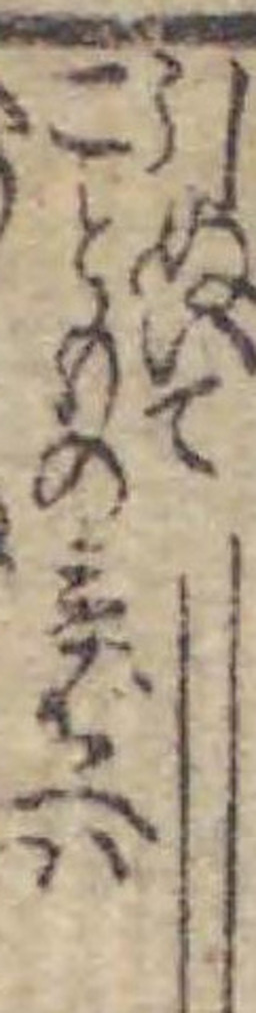ことものみばへは
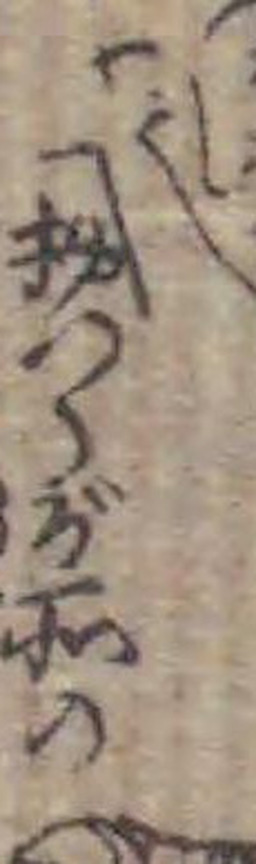〽おいらが所の

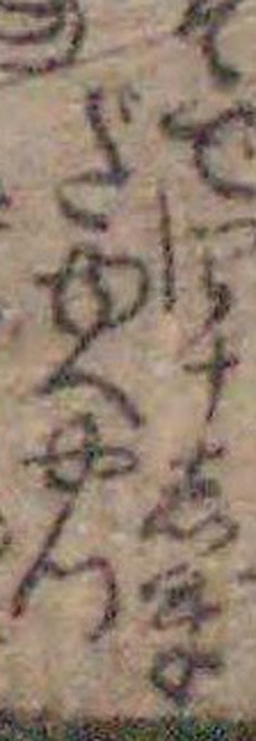だゆへやつ
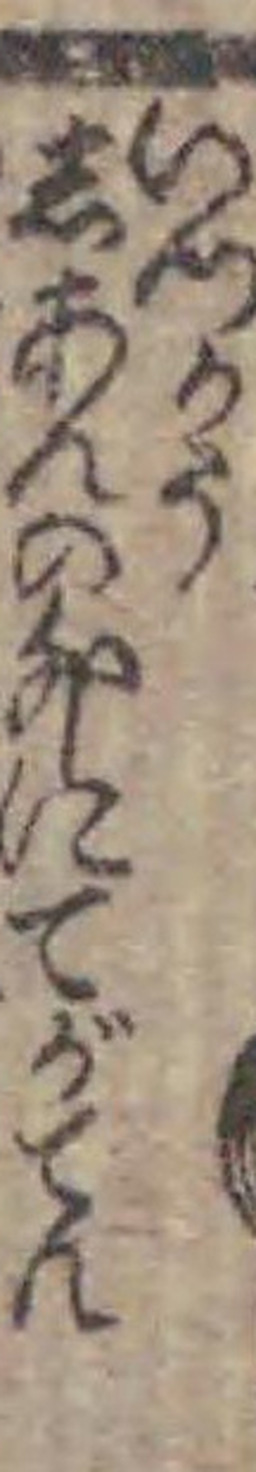しあんの外にてがてん
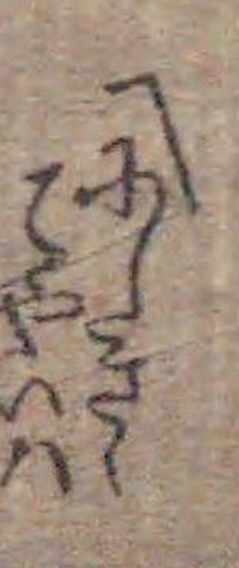〽にしきゝ
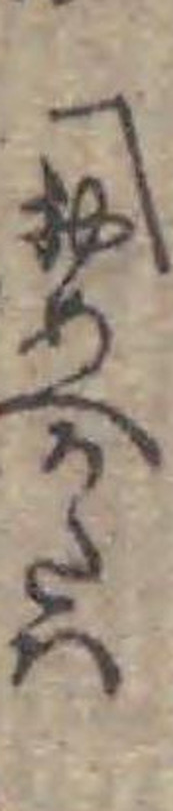〽おめへかたは
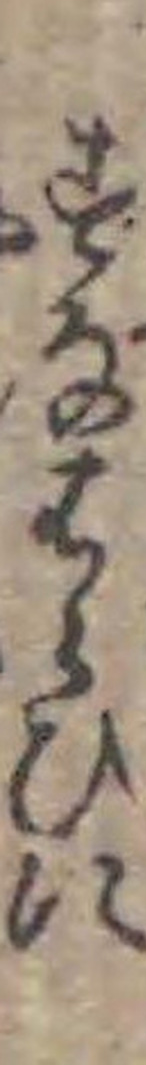すなはらひに
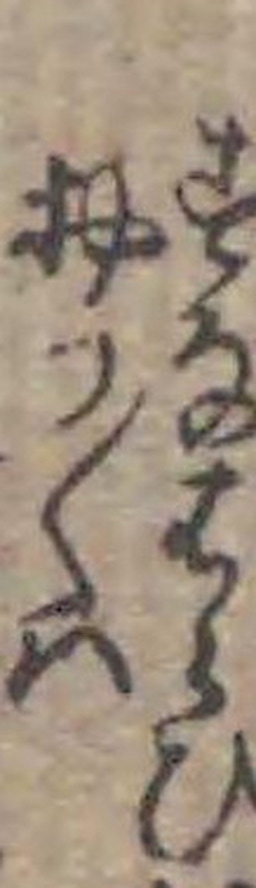おり〳〵は
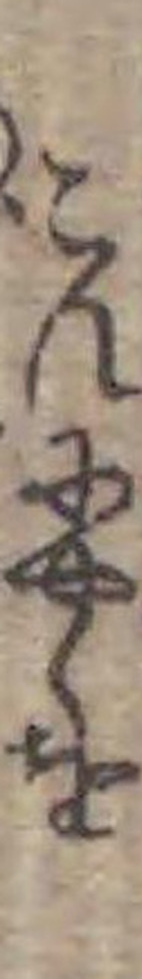こんにやくを
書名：奇妙頂礼胎錫杖 : 3巻
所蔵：国立国会図書館 National Diet Library, JAPAN
